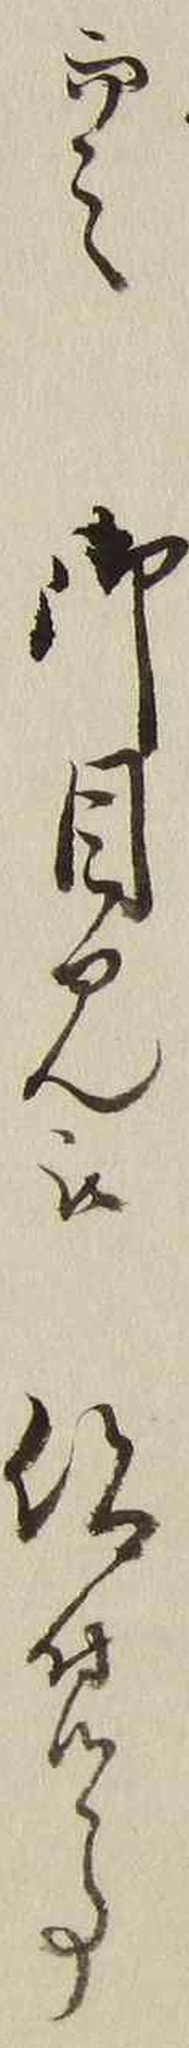而之御目見被仰付候事
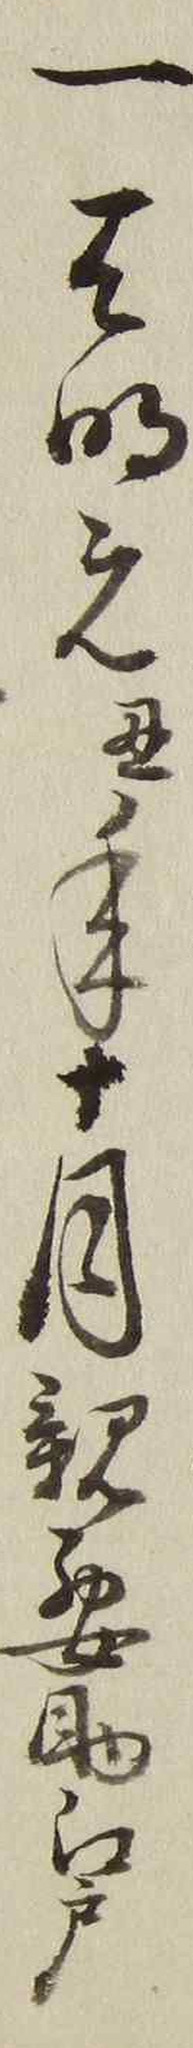一天明元丑年十月親要助江戸
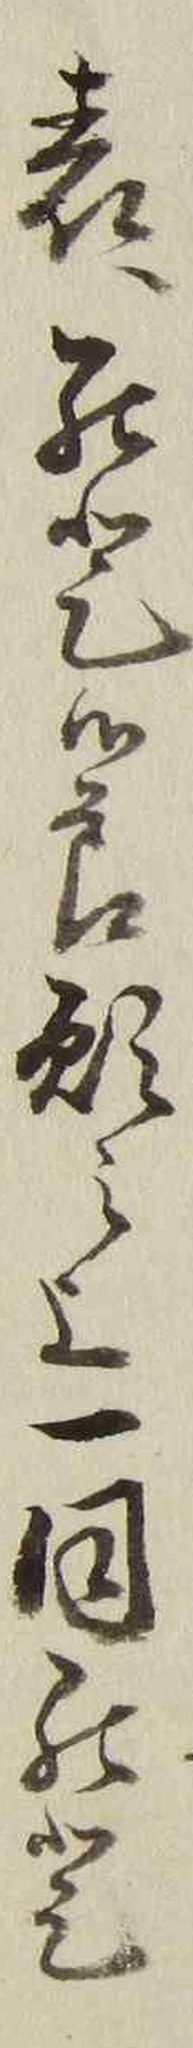表へ罷登候節願之上一同罷登

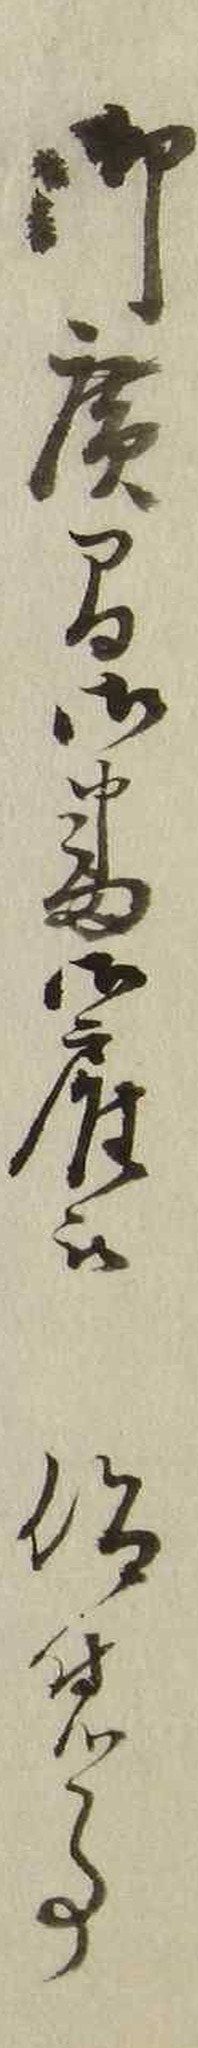御広間御番御雇被仰付候事
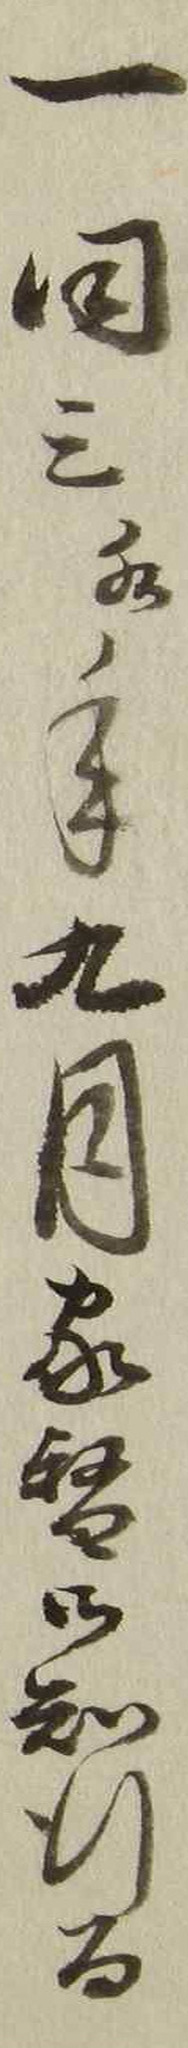一同三卯年九月家替御知行百
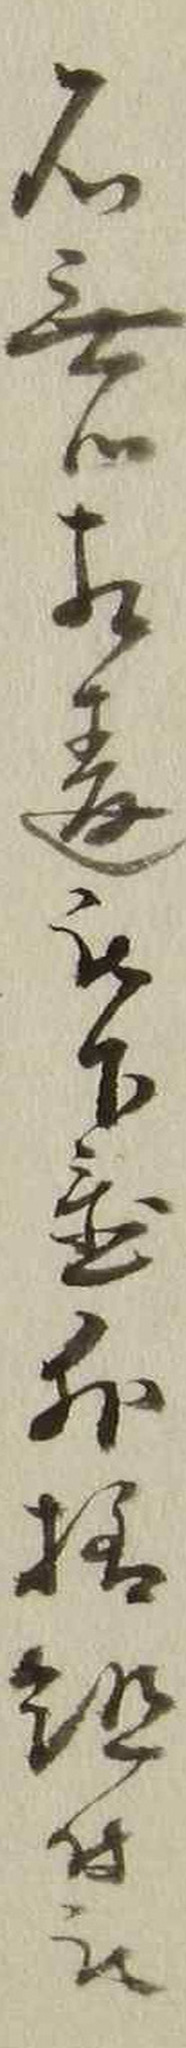石無御相違被下置外様組付被
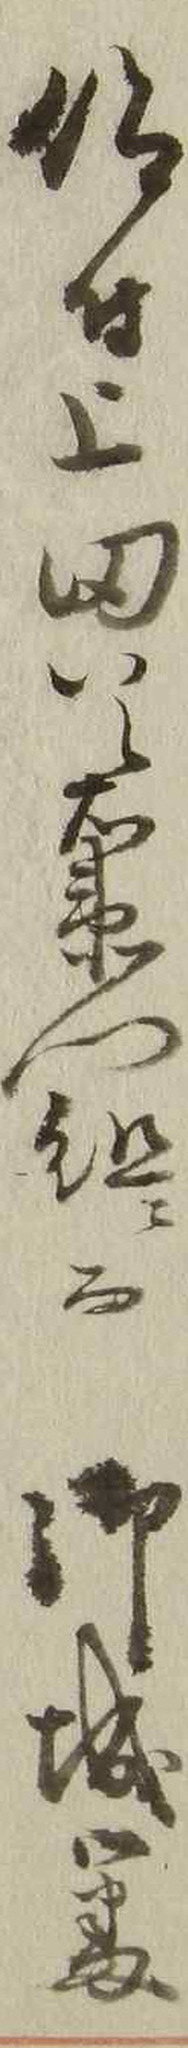仰付上田八郎右衛門組ニ而御城御番
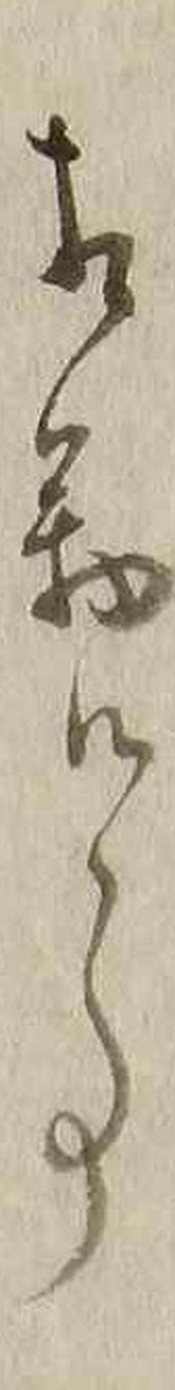相勤候事
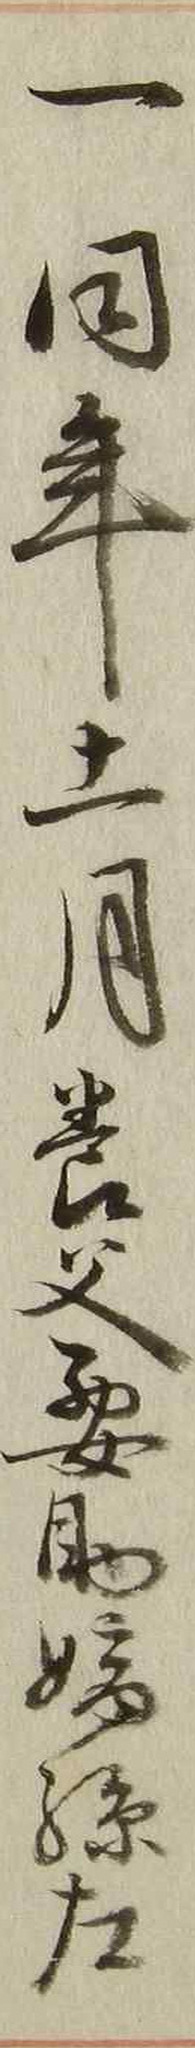一同年十一月養父要助嫡孫左
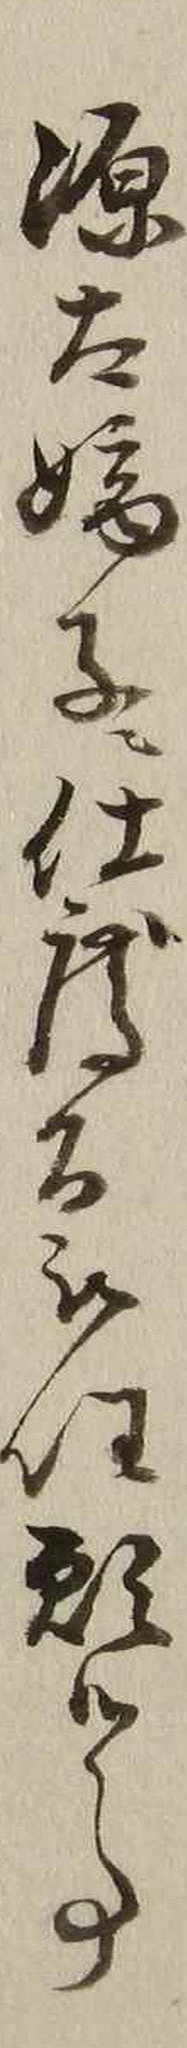源太嫡子ニ仕度旨被任願候事
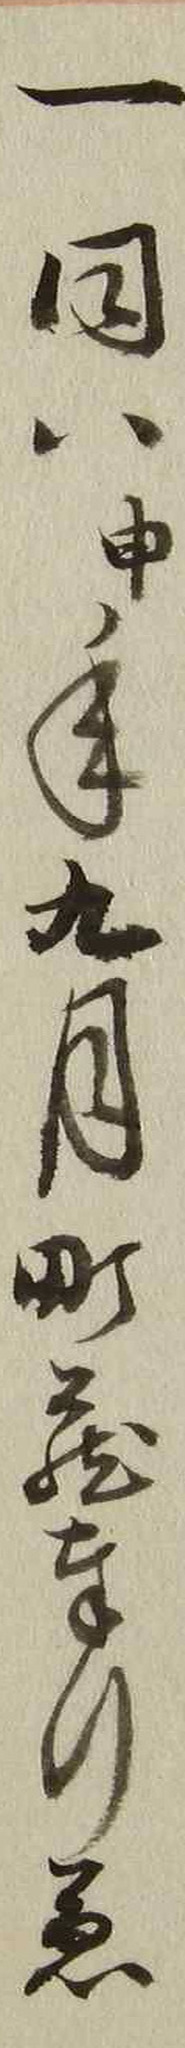一同八申年九月町蔵奉行兼
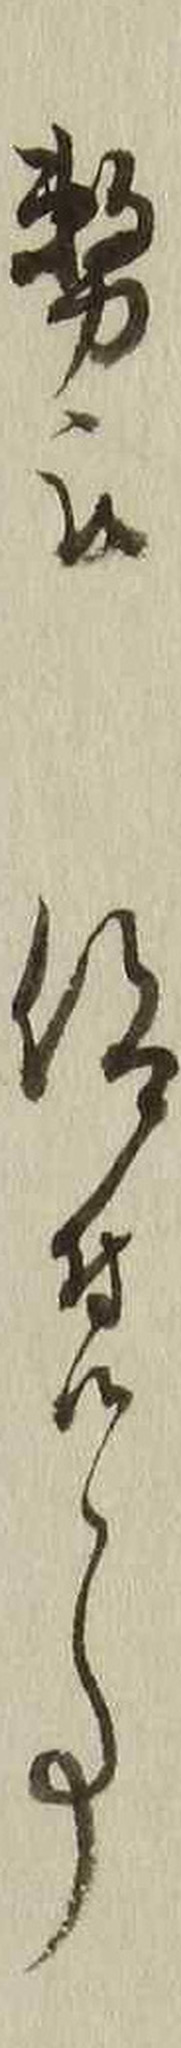務被仰付候事
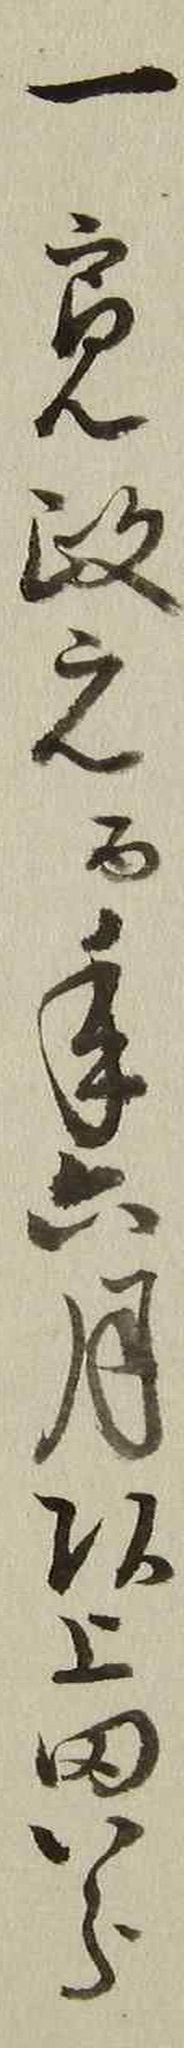一寛政元酉年六月頭上田八郎
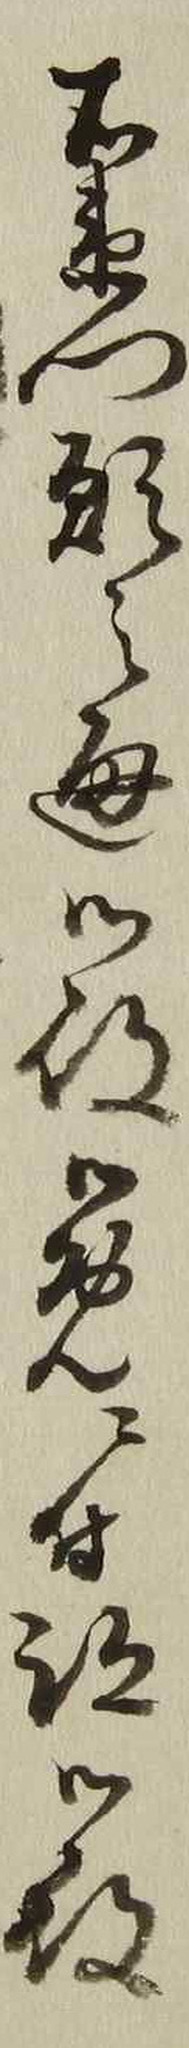右衛門願之通御役御免ニ付組御役
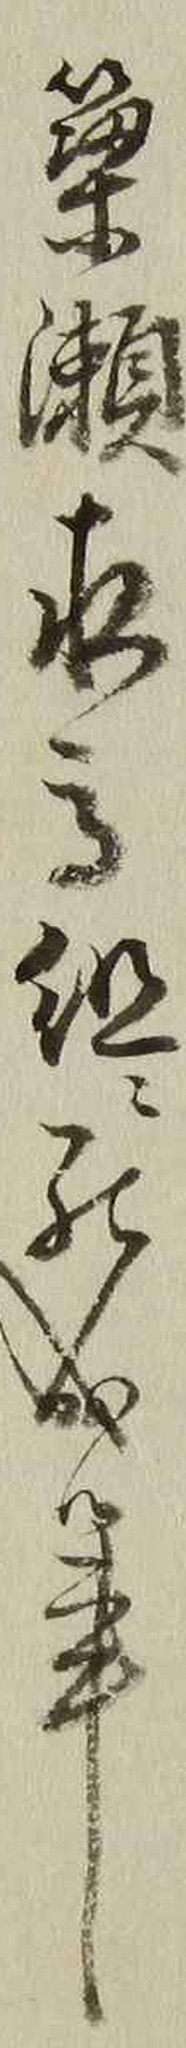簗瀬求馬組ニ罷成候事
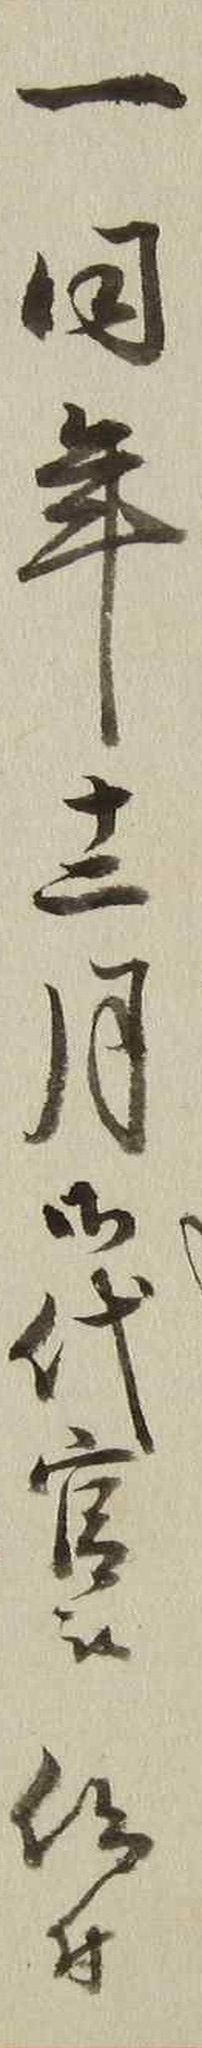一同年十二月御代官被仰付
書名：諸士系譜　巻之53　に之部4
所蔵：会津若松市立会津図書館
